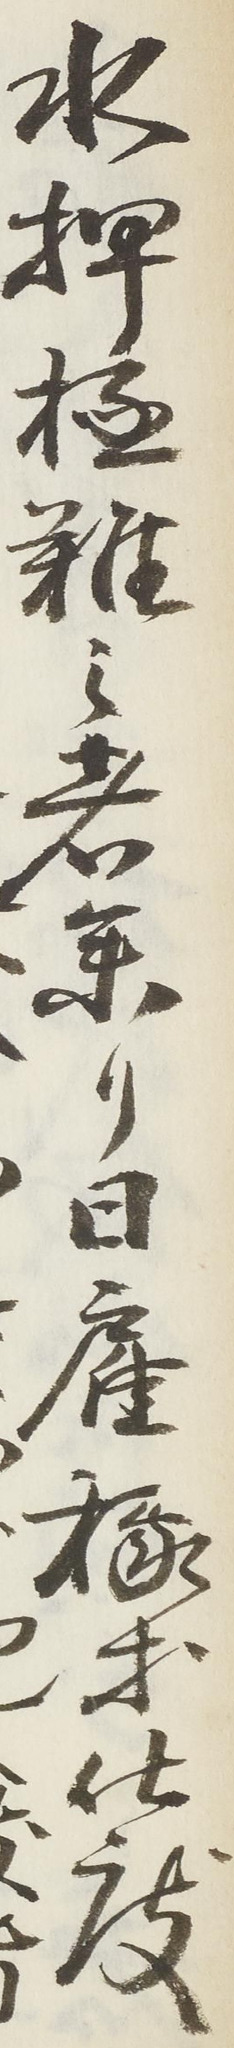水押極難之者参り日雇様等仕度
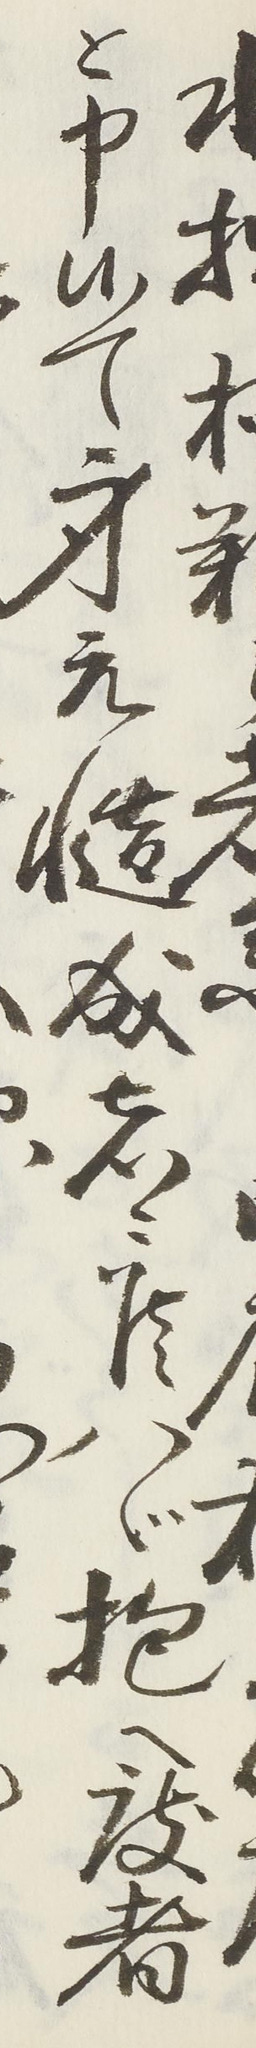と申候て身元慥成者二候ハゞ抱へ度者
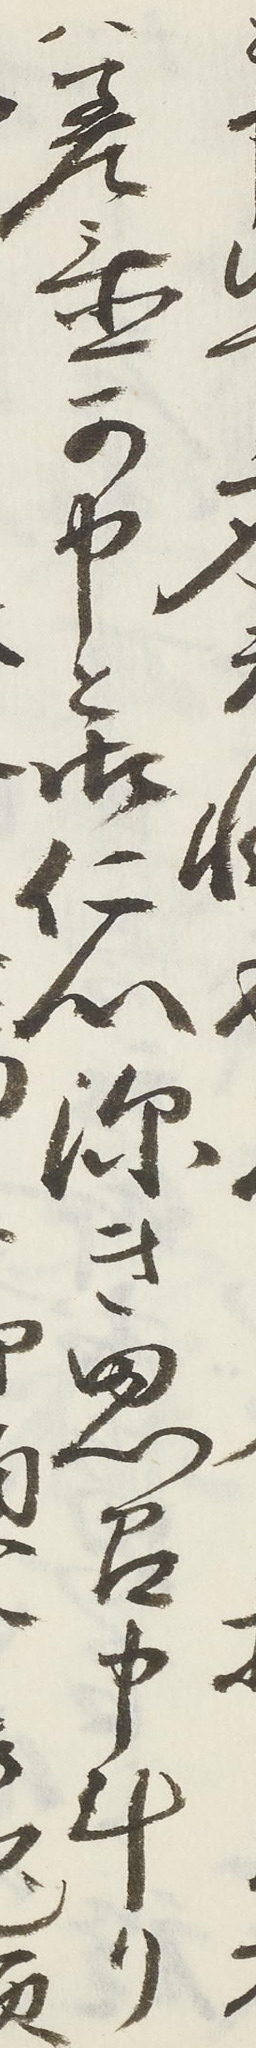は差置可申と御仁心深き思召申斗り
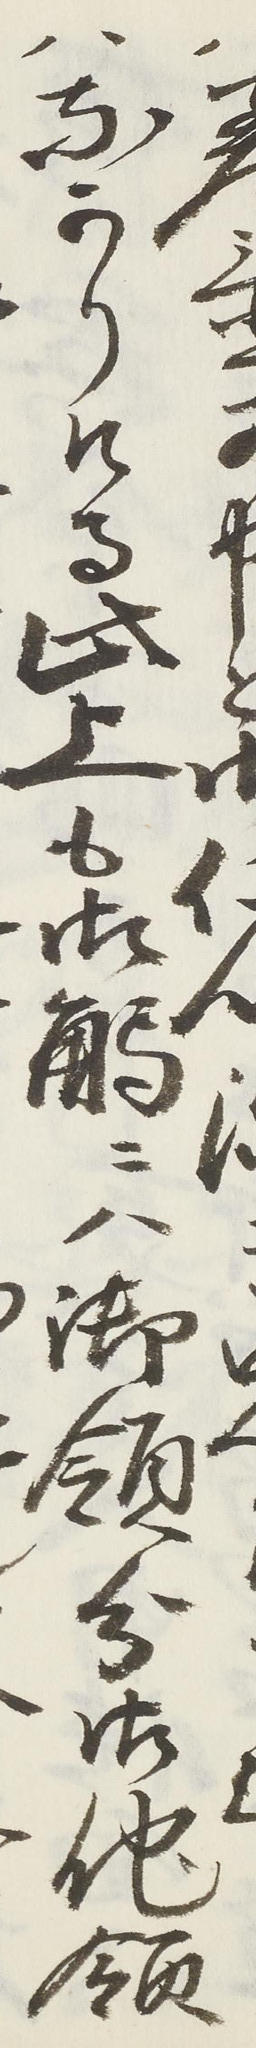ハなかりける此上も御觸二ハ御領分御他領
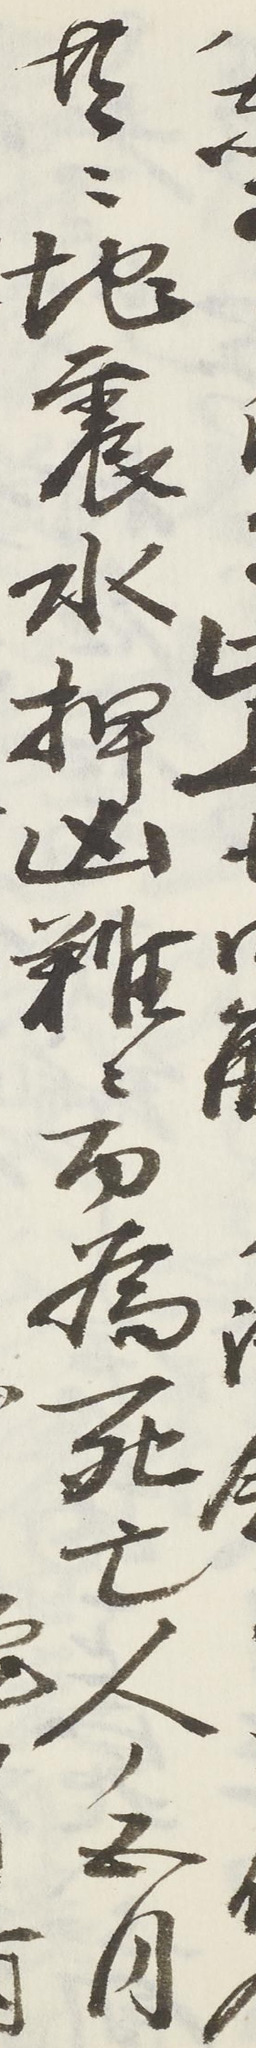共二地震水押凶難二而為死亡人ノ五月
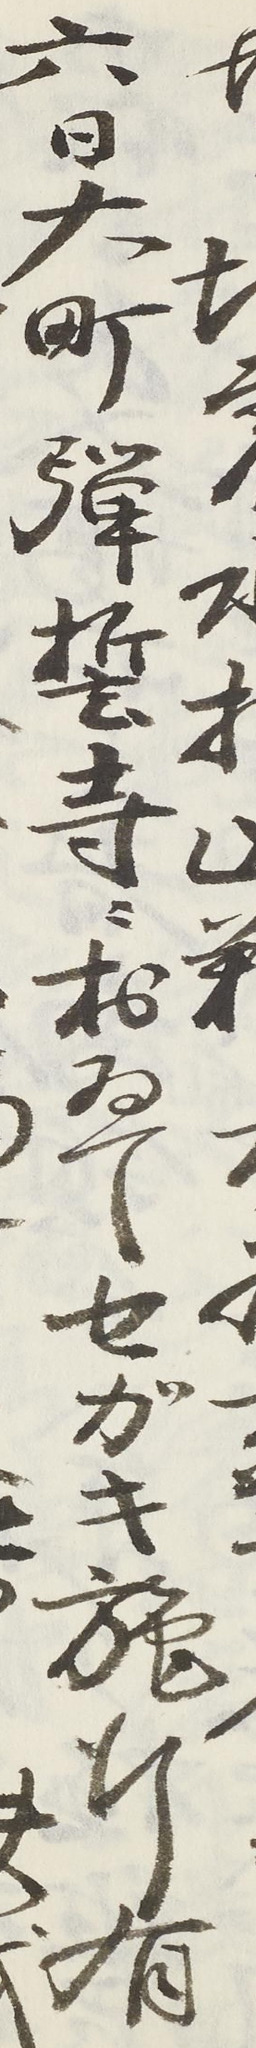六日大町弾誓寺二おゐてセガキ施行有
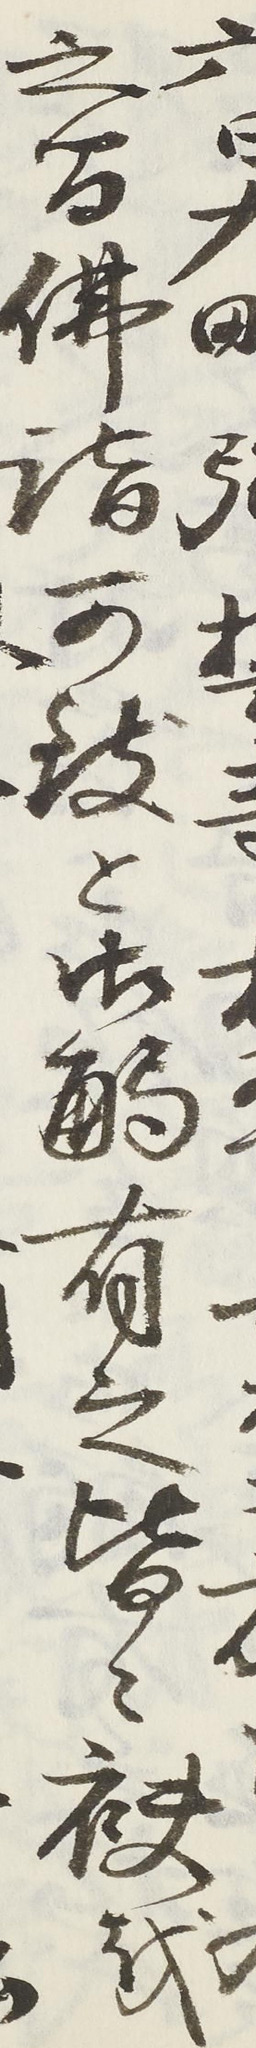之間仏詣可致と御觸有之皆々袂を
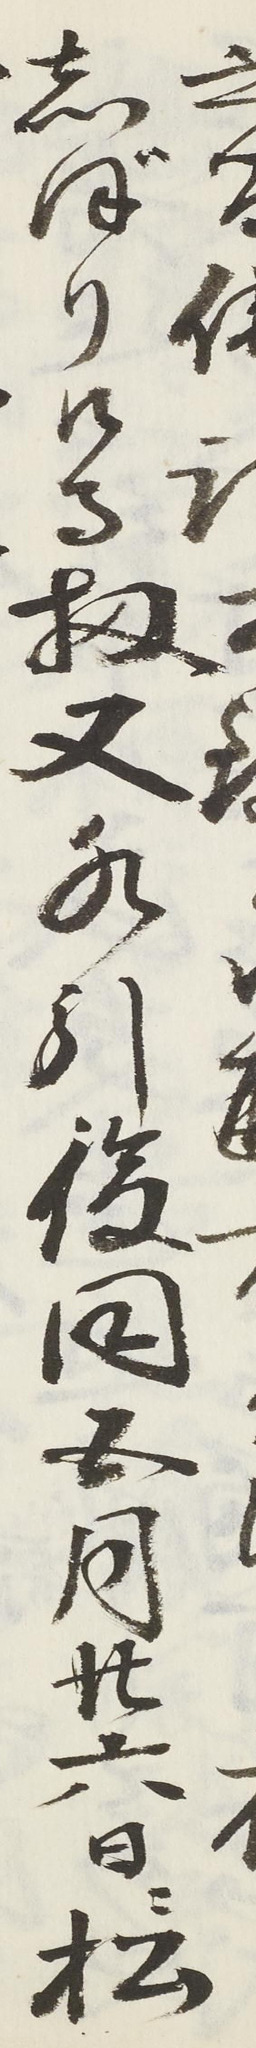しぼりける扨又水引後同五月廿六日二松
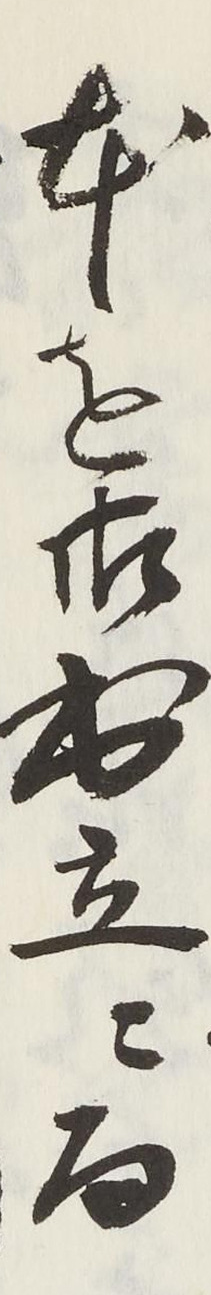本を御出立二而
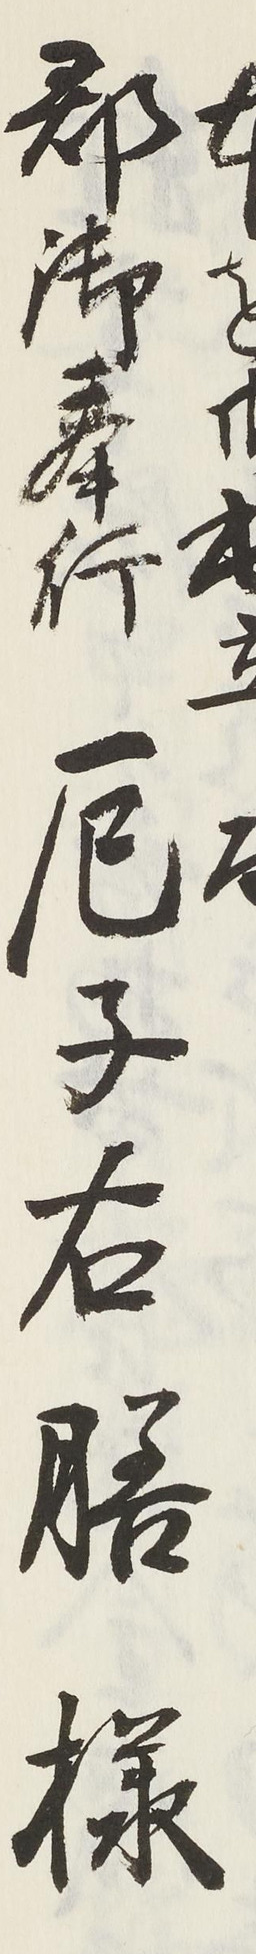郡御奉行尼子右膳様
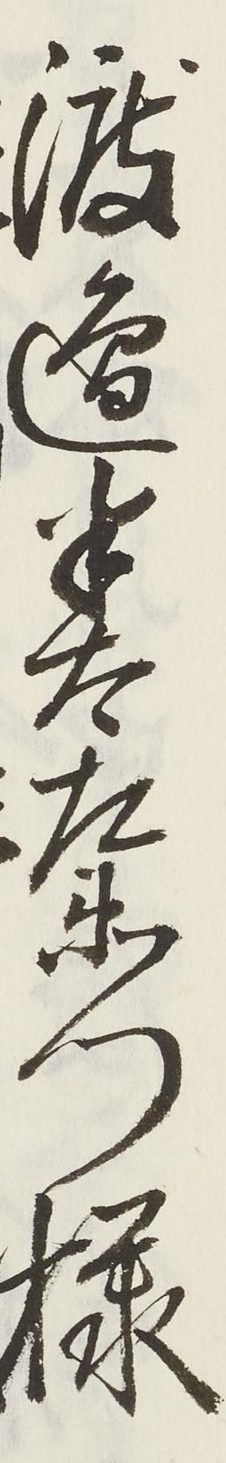渡辺半太左衛門様
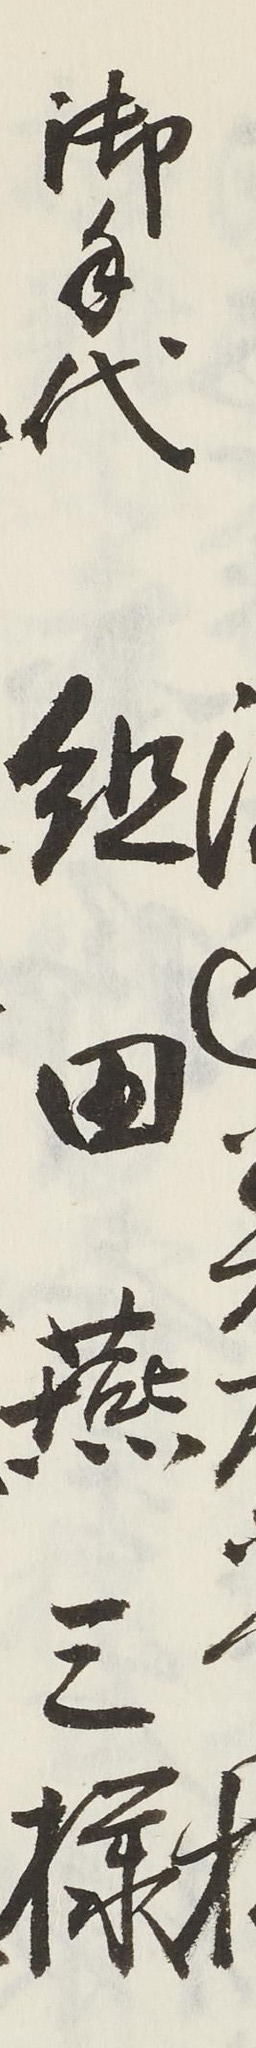御手代組田燕三様
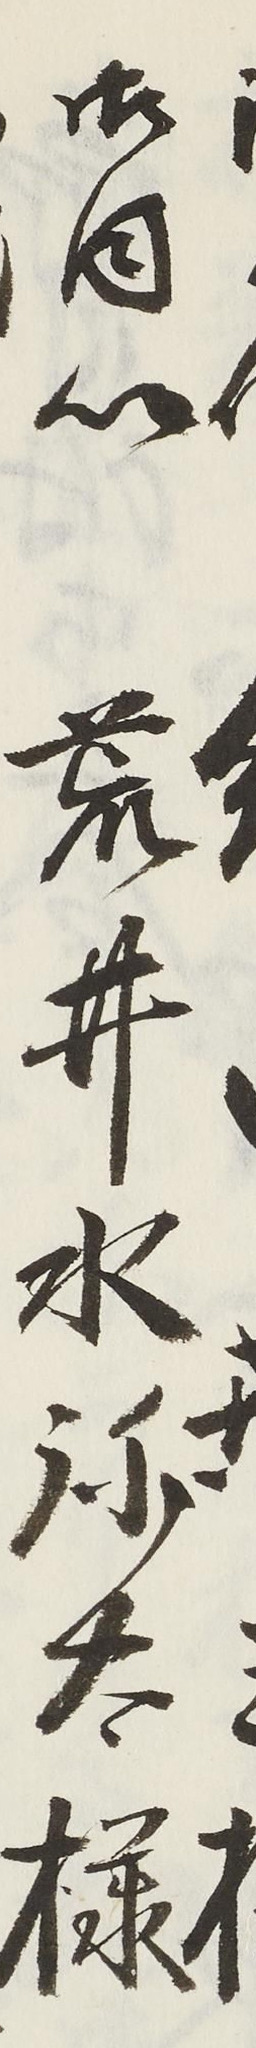御同心荒井水弥太様
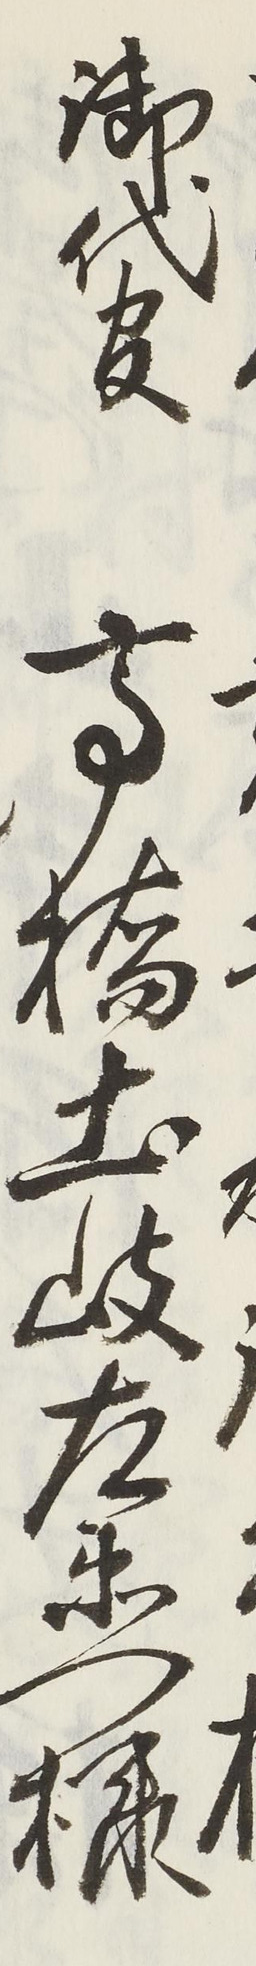御代官高橋土岐左衛門様
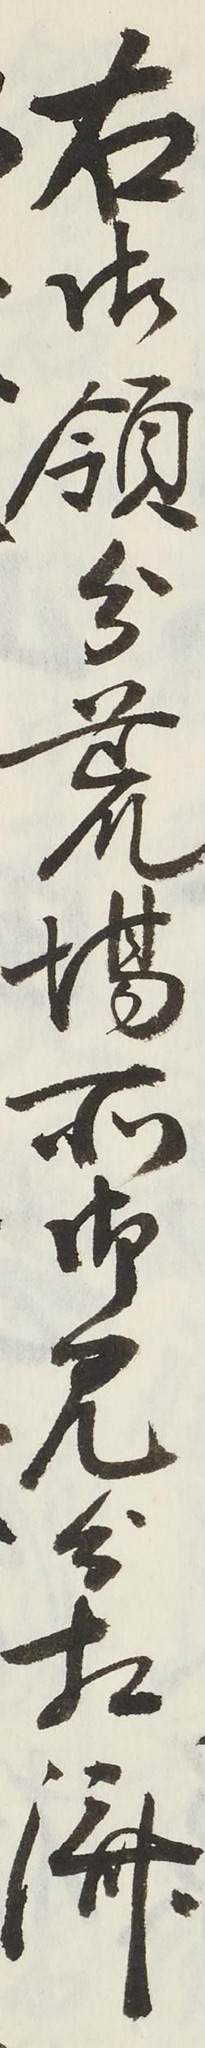右御領分荒場所御見分相済
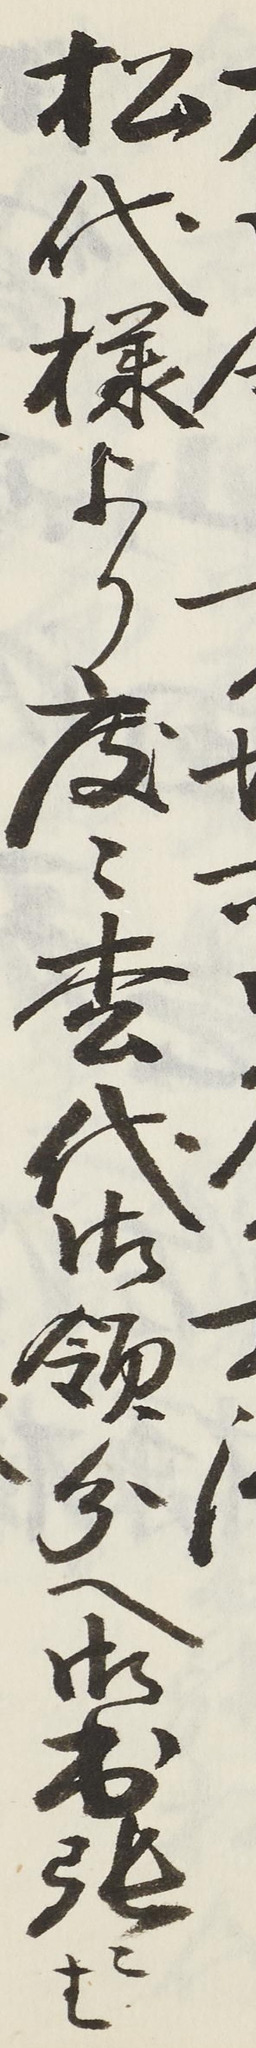松代様より度々松代御領分へ御出張二は
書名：弘化四年地震記
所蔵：東京大学地震研究所図書室 Earthquake Research Institute Library, The University of Tokyo, JAPAN
